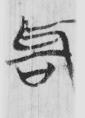{㠯ㅋ}
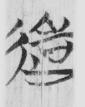造
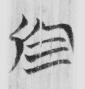於
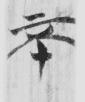不
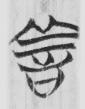善
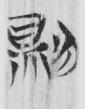則
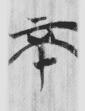不
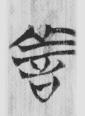善
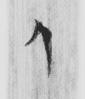人
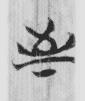至
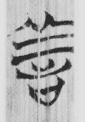善
